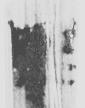庶
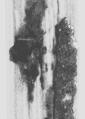民
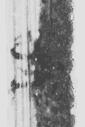卑
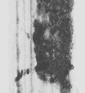之
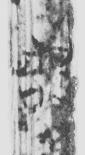若
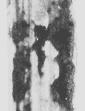飛
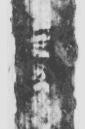鳥
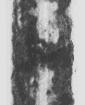之
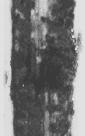相
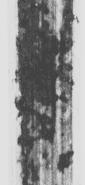柹
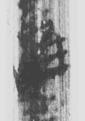唯
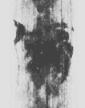所
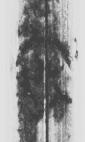安
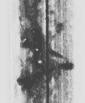之
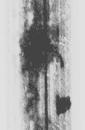木
